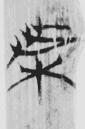枼
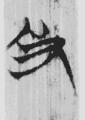及
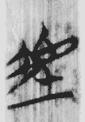𫊟
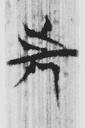先
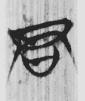君
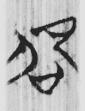{召㔾}
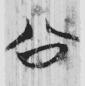公
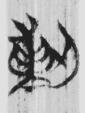剌
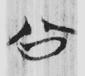公
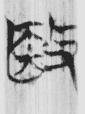殹
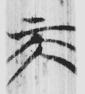天
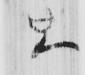也
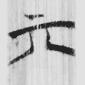亓
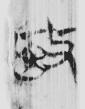殹
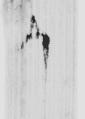人
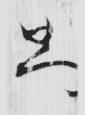也
